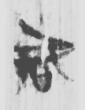者
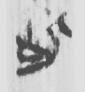此
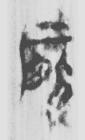所
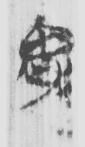{胃刀}
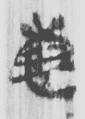惠
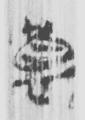惪
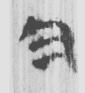今
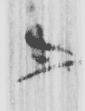之
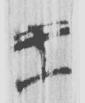王
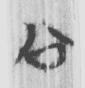公
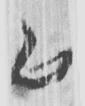㠯（以）
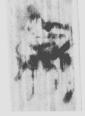眾
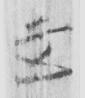正
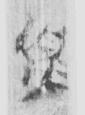寡
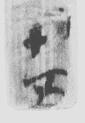{十五}
